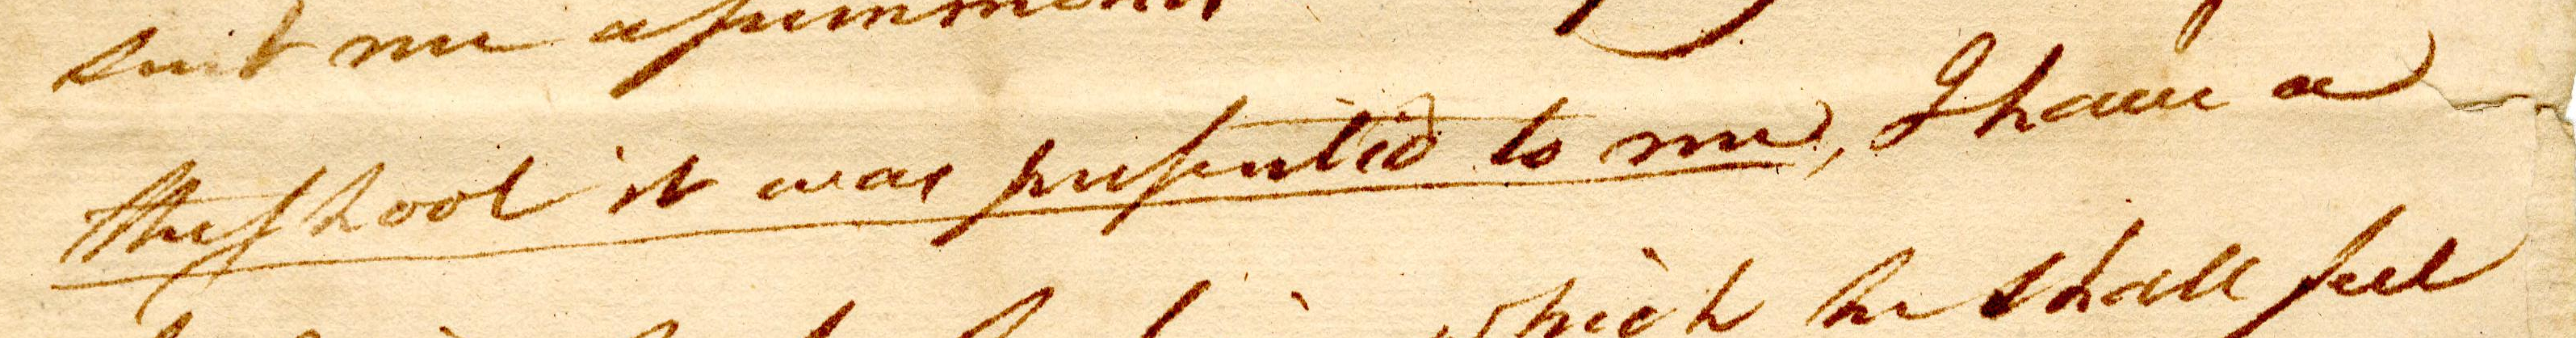the shool it was presented to me, I have a
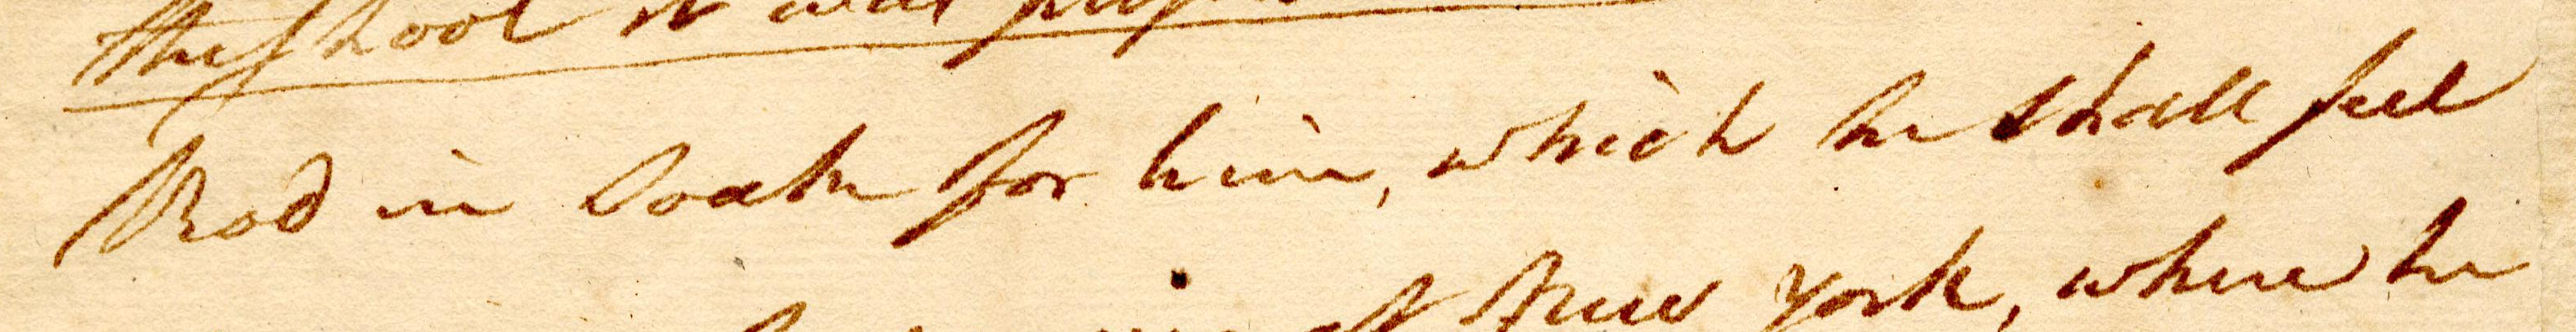Rod in Poak for him, which he shall feel
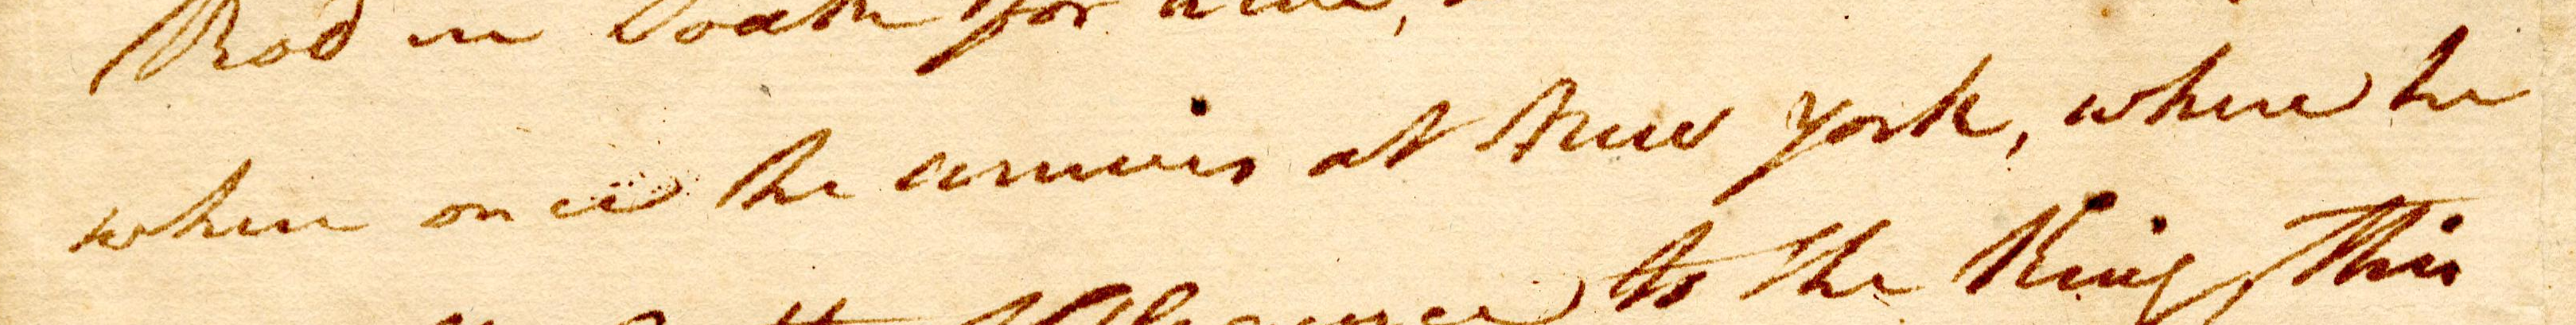when once he arrives at New York, where he
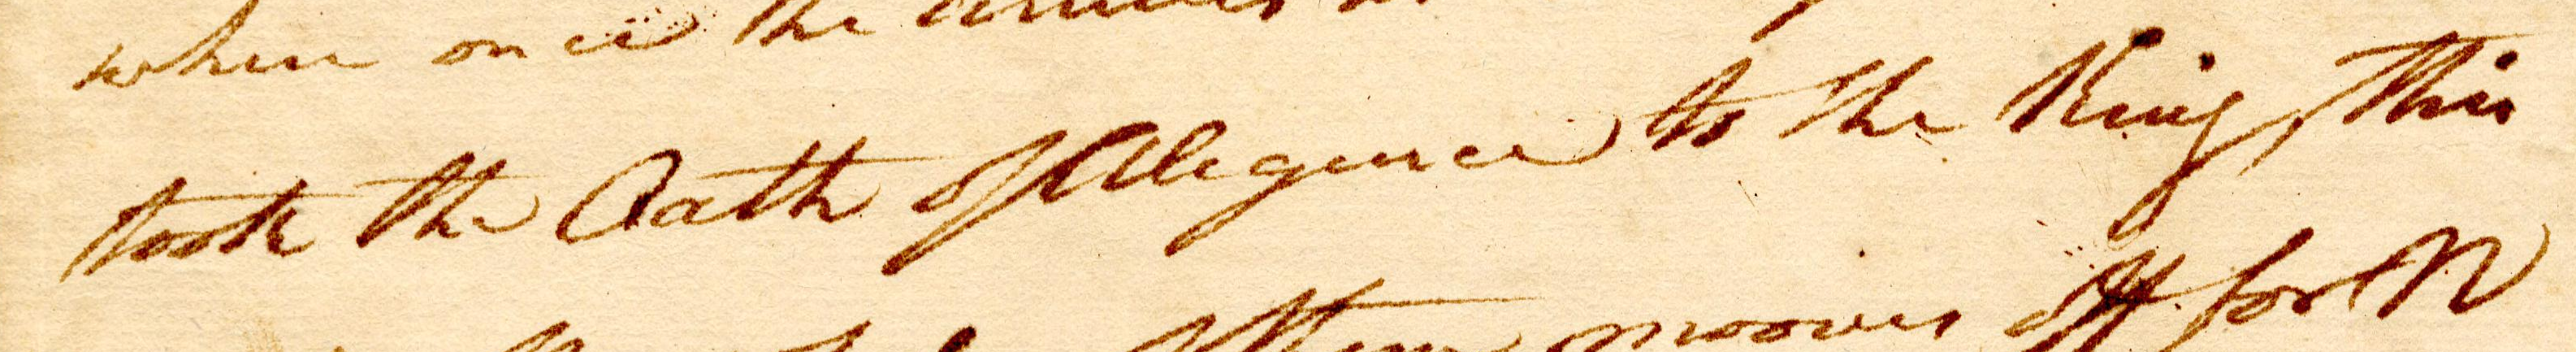took the Oath of Allegiance to the King, this
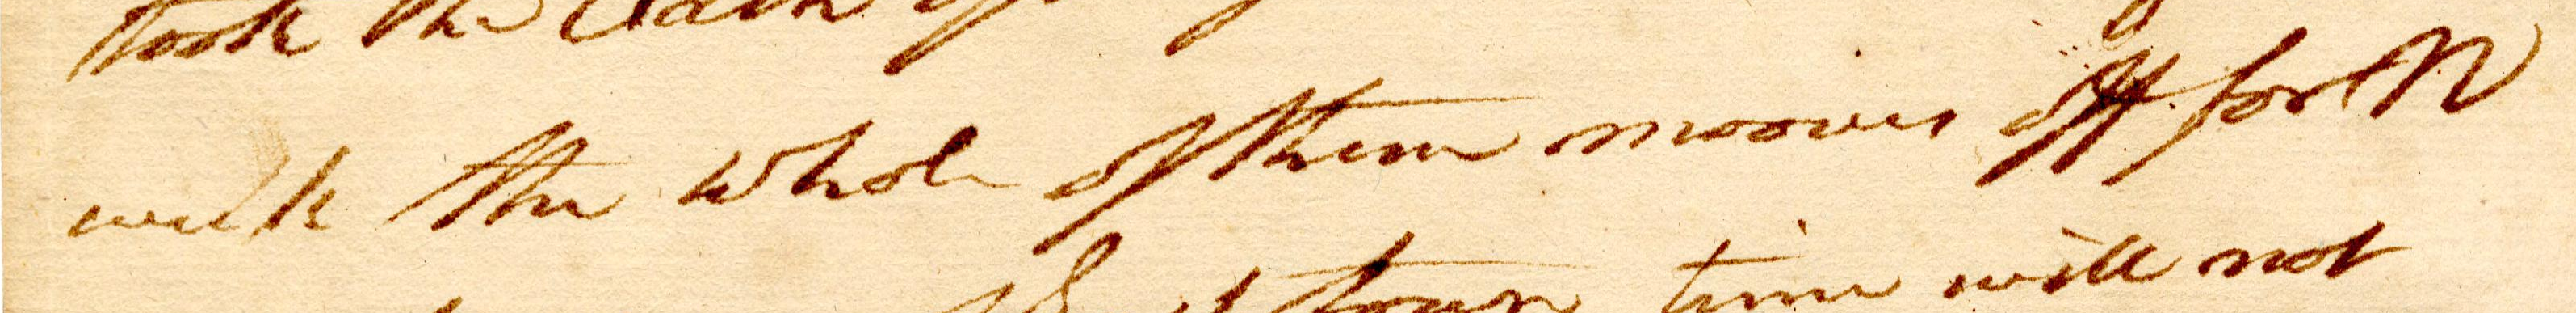will the whole of them moving off for N
